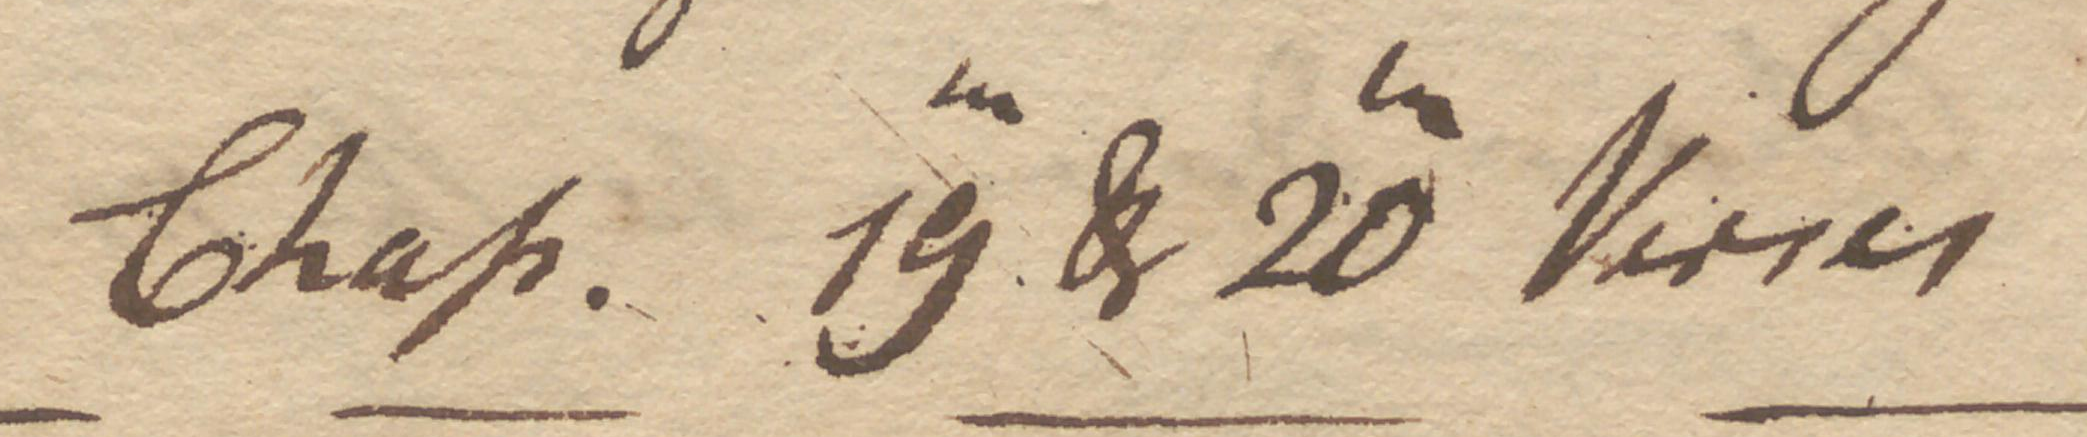Chap. 19^th. & 20^th Verses
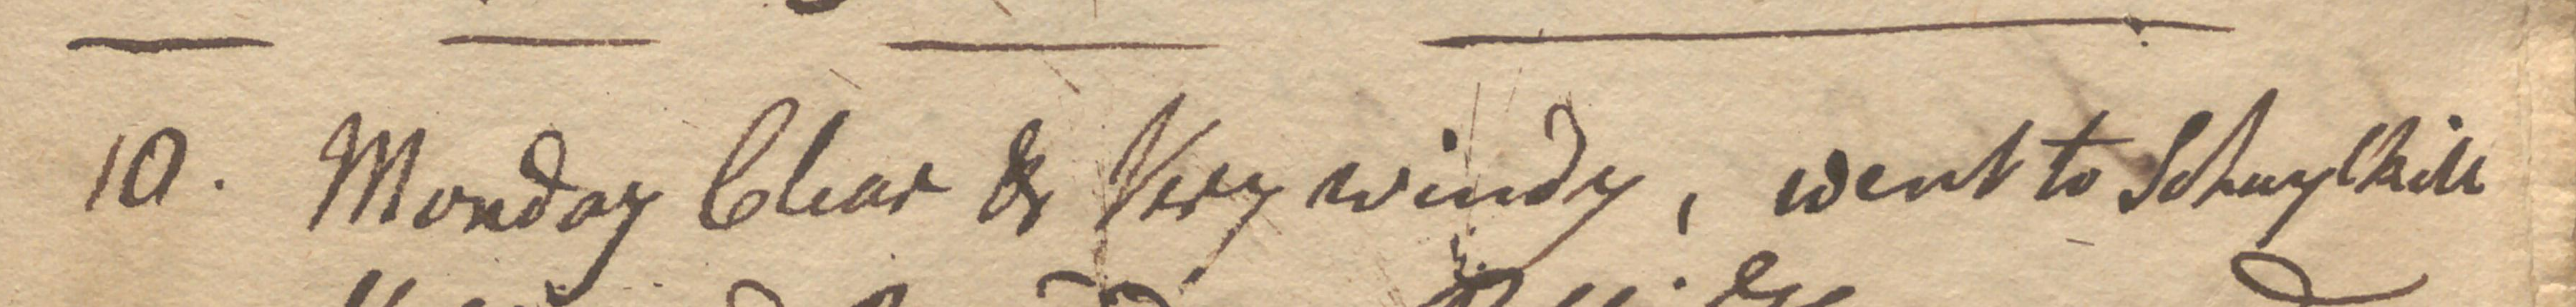10. Monday Clear & Very windy, went to Schuylkill
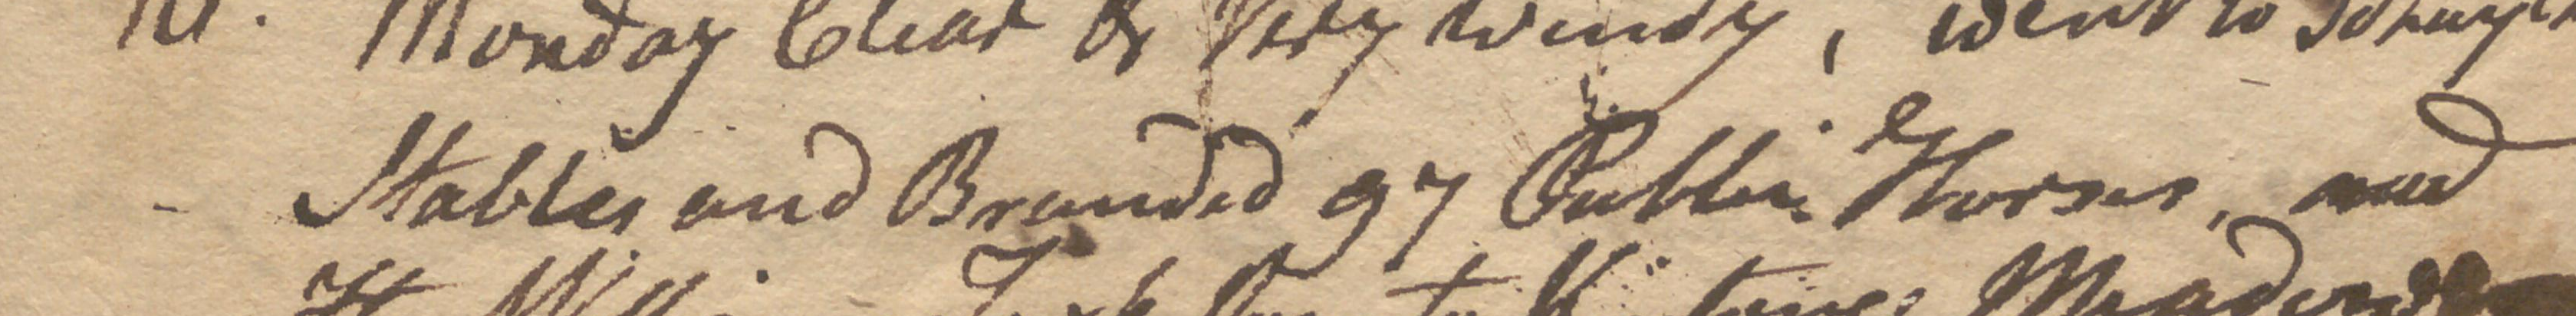Stables and Branded 97 Public Horses, and
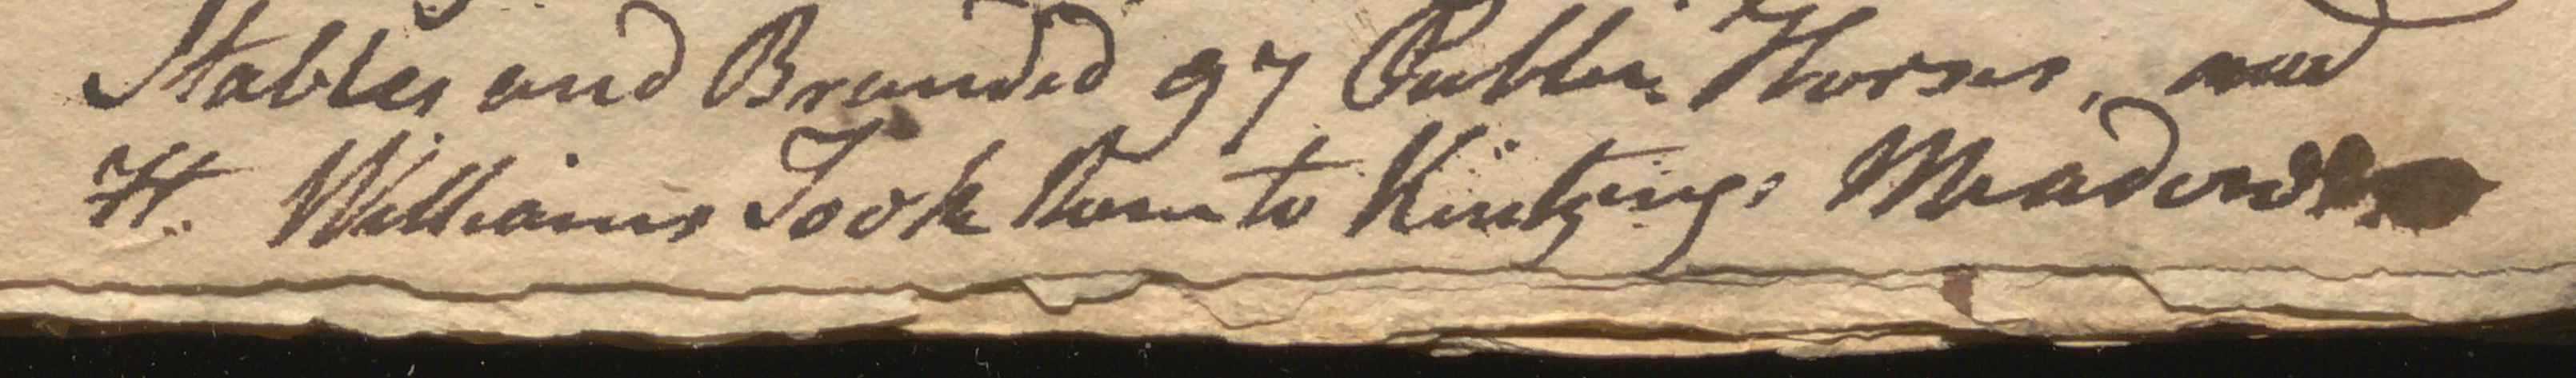H. Williains Took them to Kintzingr Meadow
